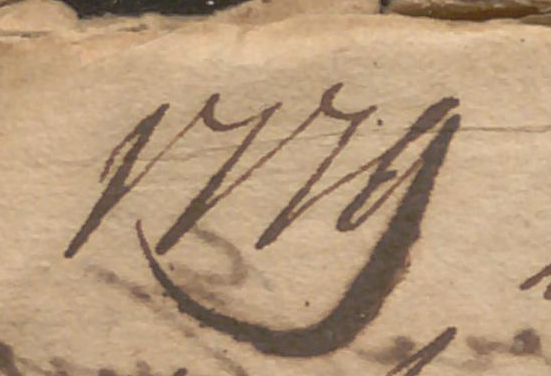I779
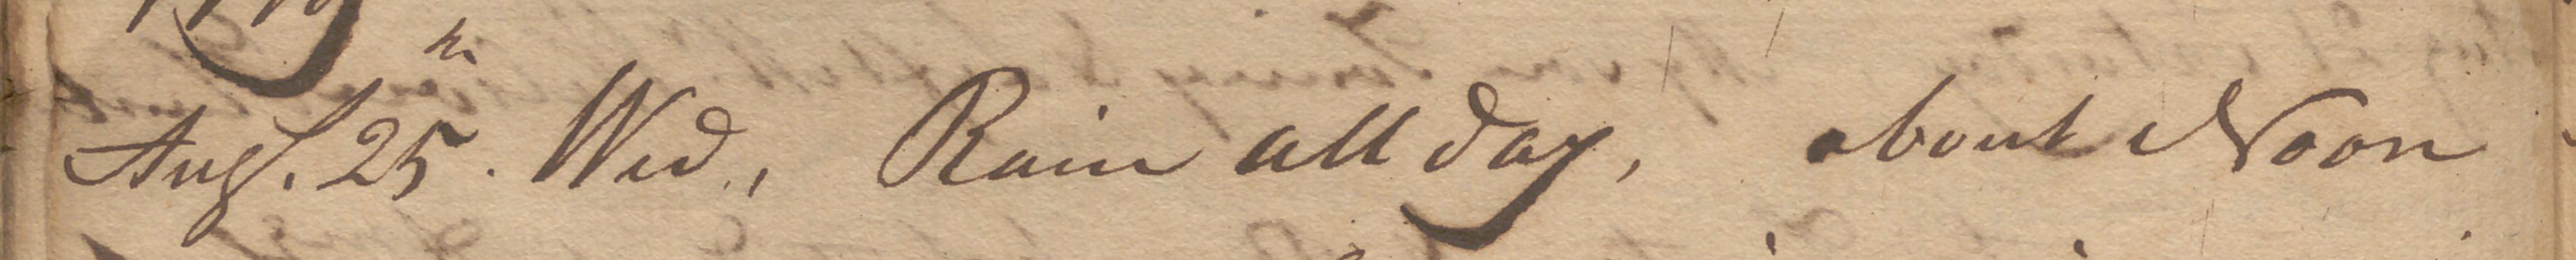Aug^t. 25^th. Wed. Rain all day, about Noon
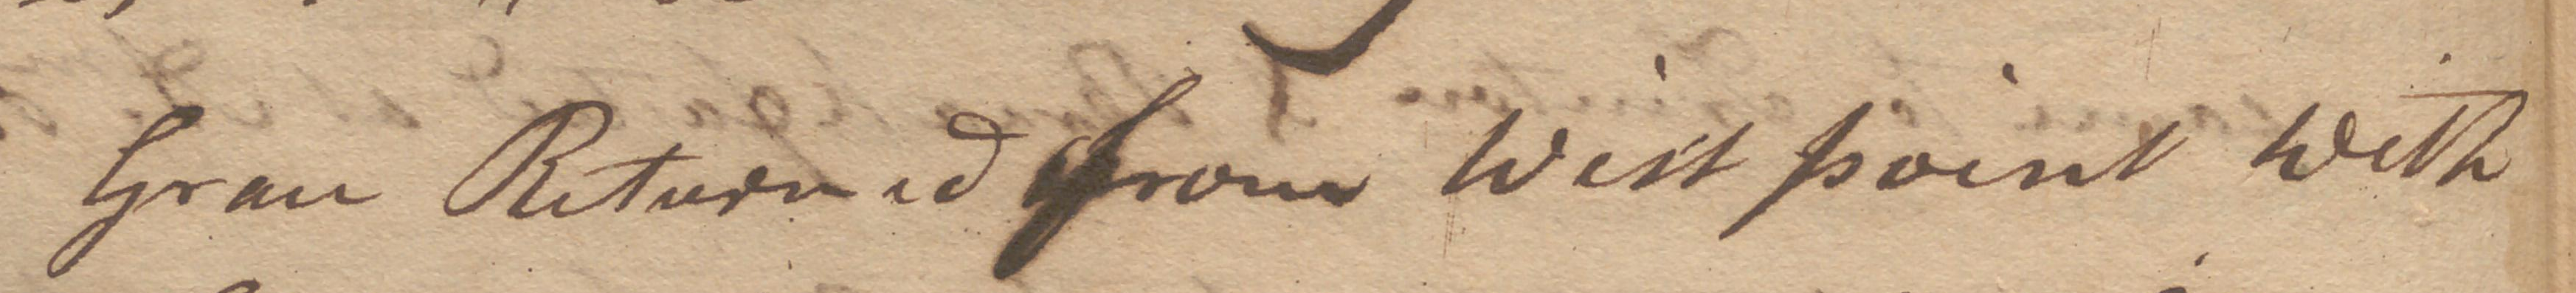Grau Returned from West point with
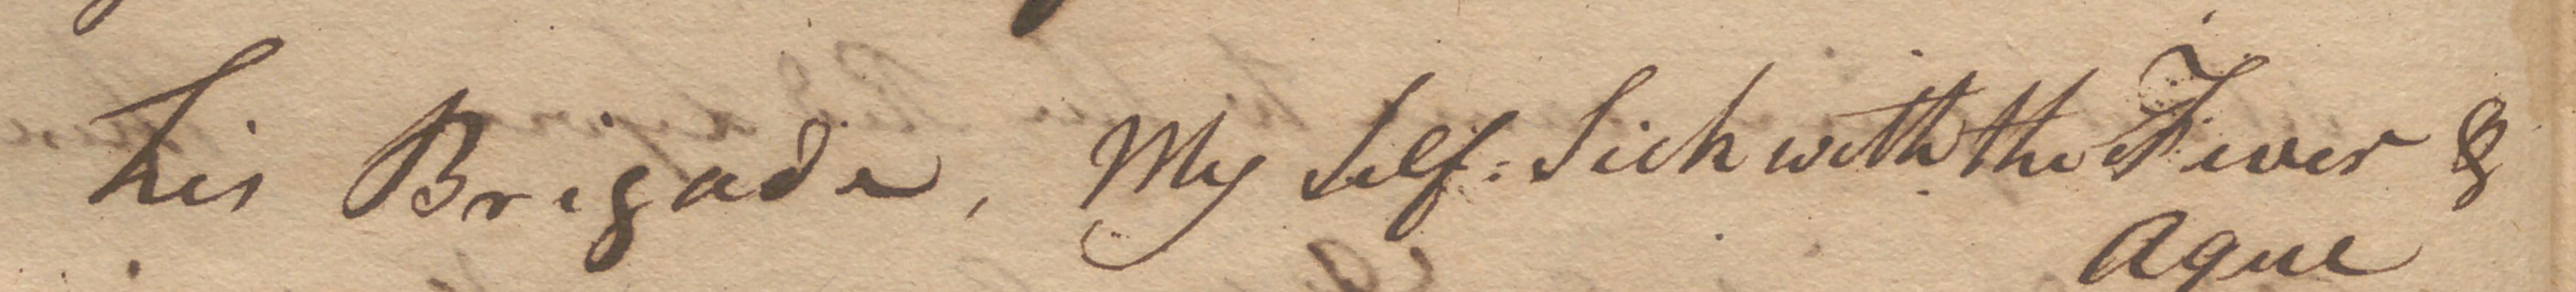his Brigade, My Self. Sick with the Fever &
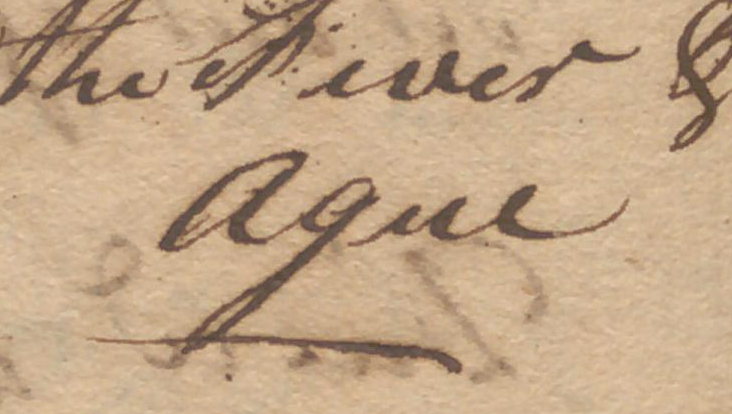Ague
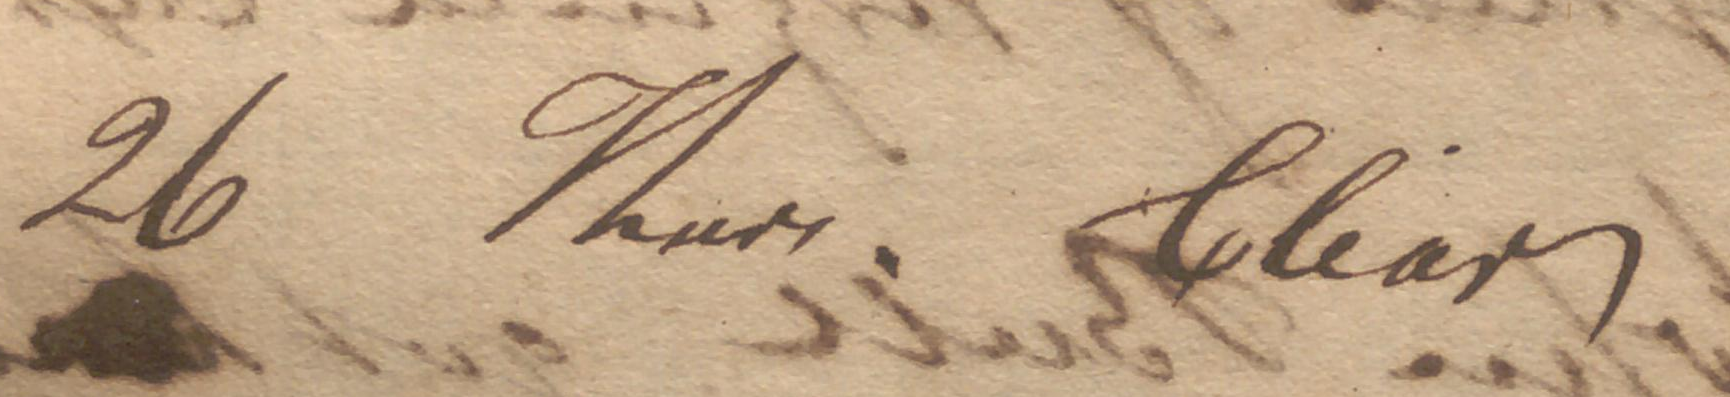26 Thurs. Clear
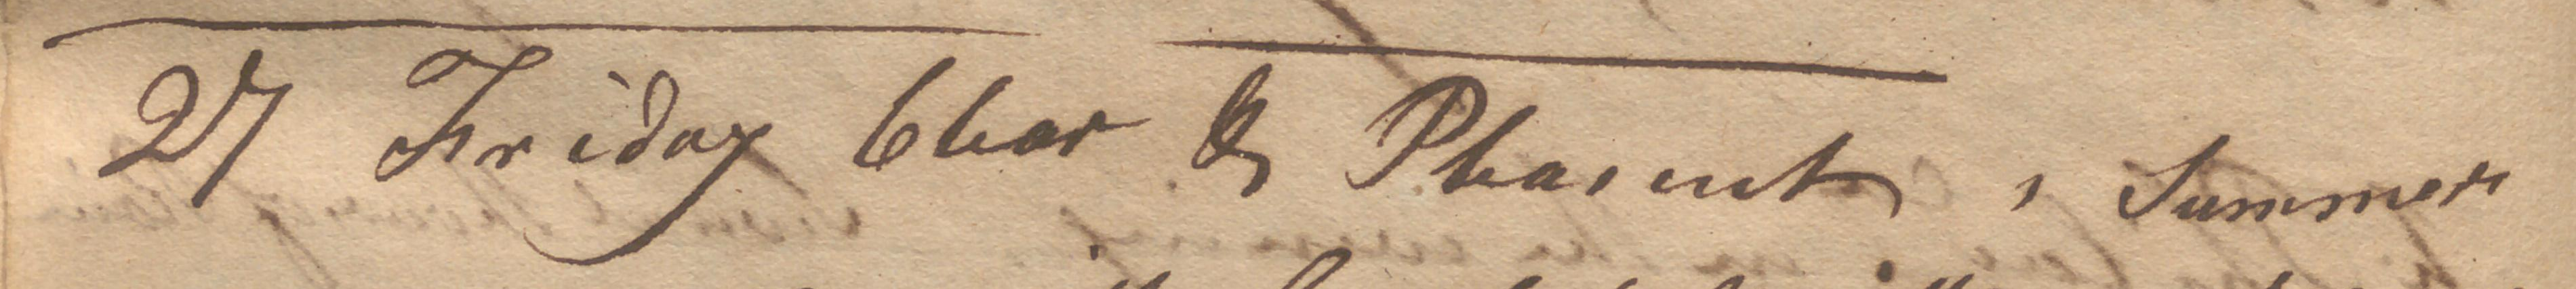27 Friday Clear & Pleasent, Summers
